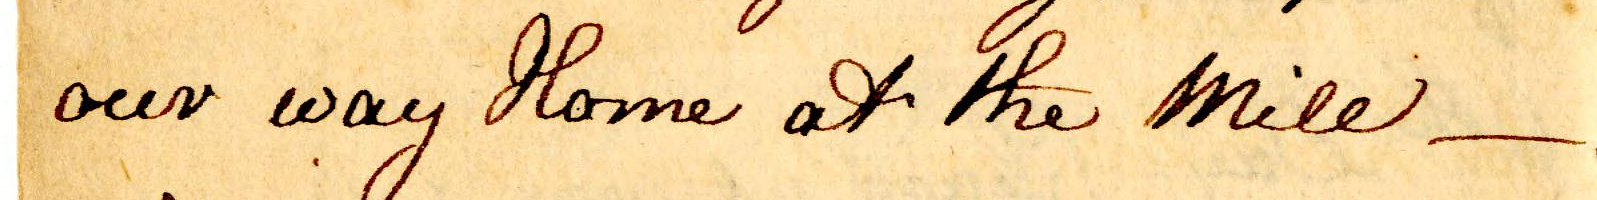our way Home at the Mill
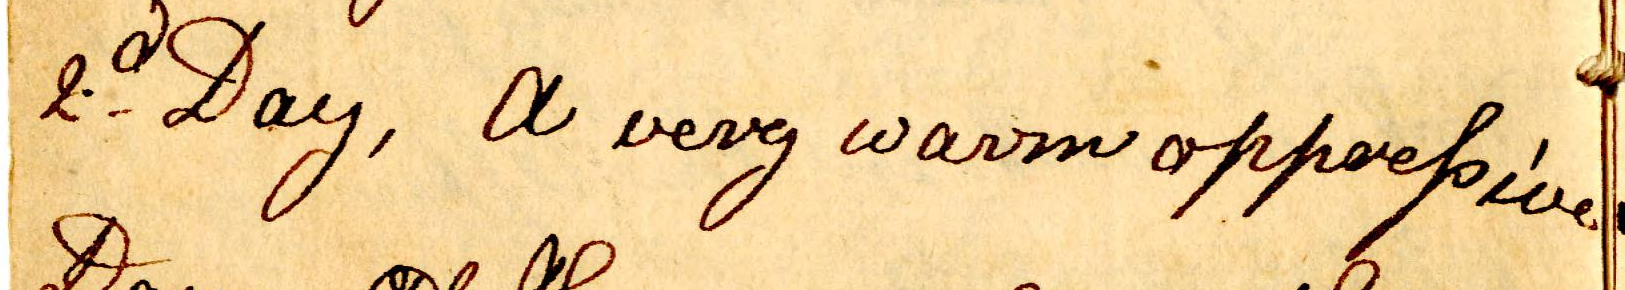2^d Day, A very warm oppressive
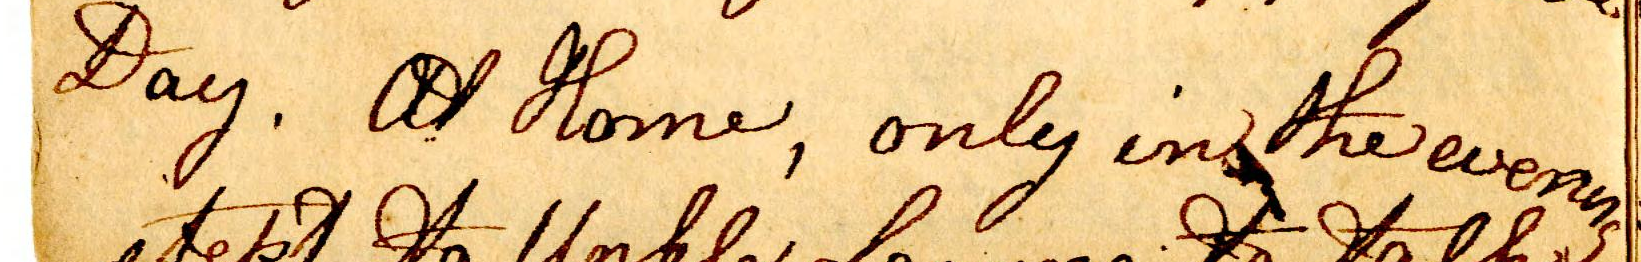Day, At Home, only in the evening
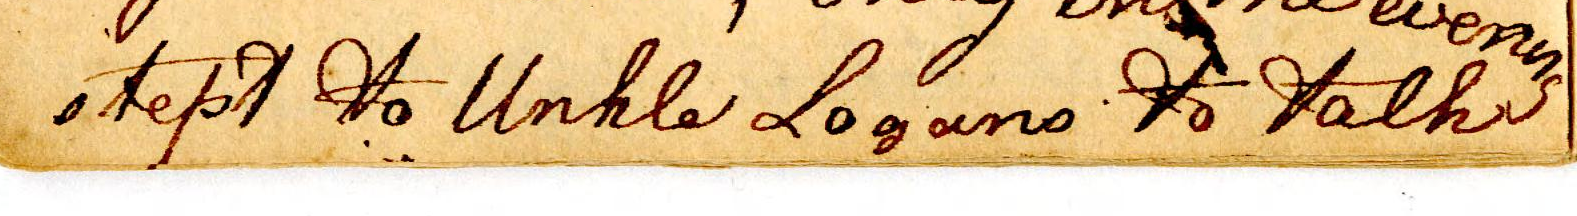stept to Unkle Logans to talk
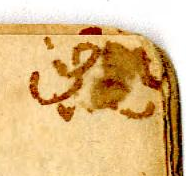35
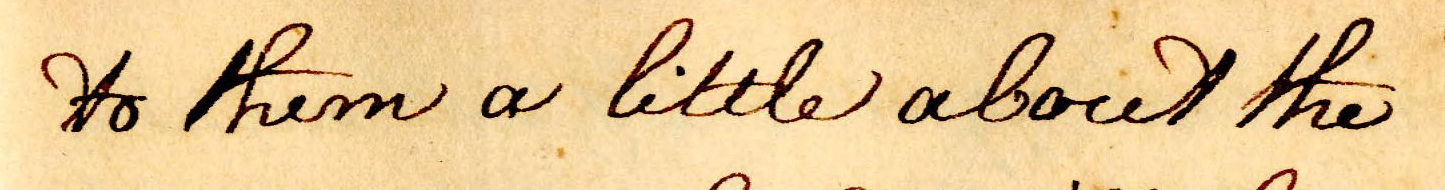to them a little about the
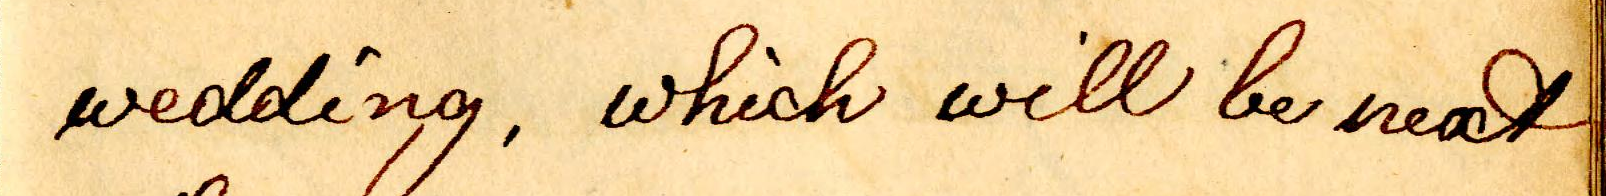wedding, which will be next
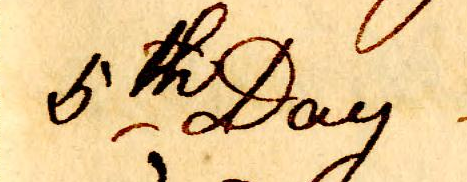5^th Day
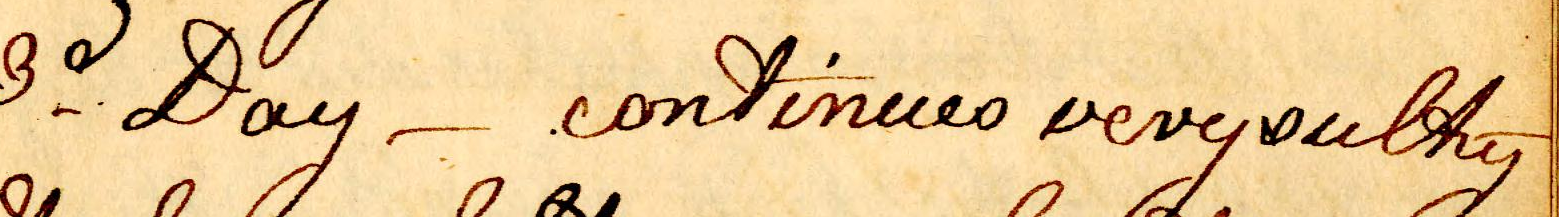3^d Day- continues very sultry
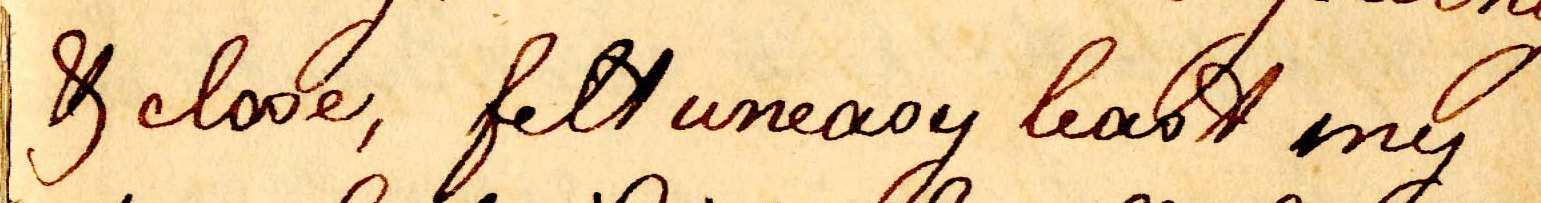& close, felt uneasy least my
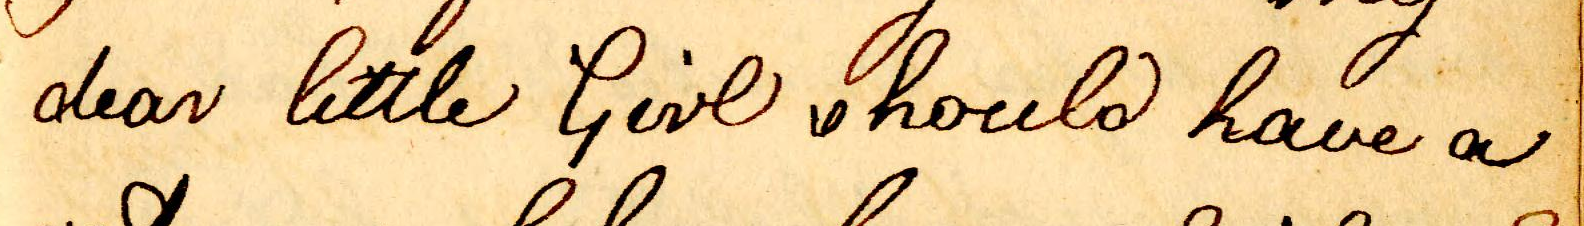dear little Girl should have a
